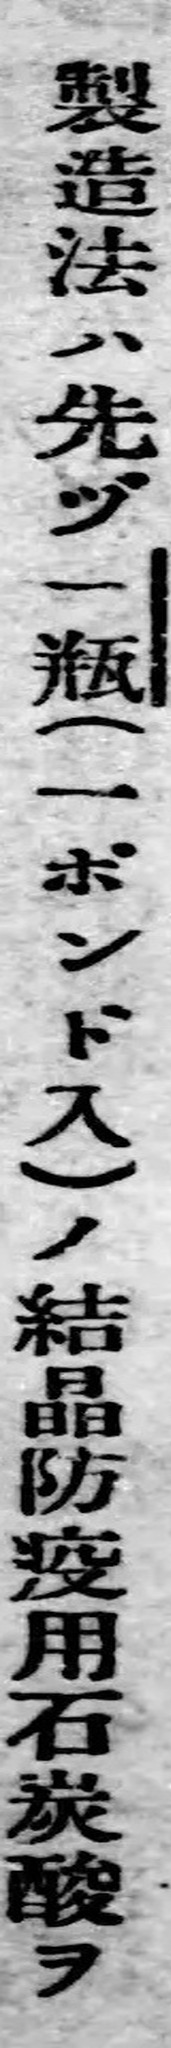製造法ハ先ヅ一瓶(一ポンド入)ノ結晶防疫用石炭酸ヲ
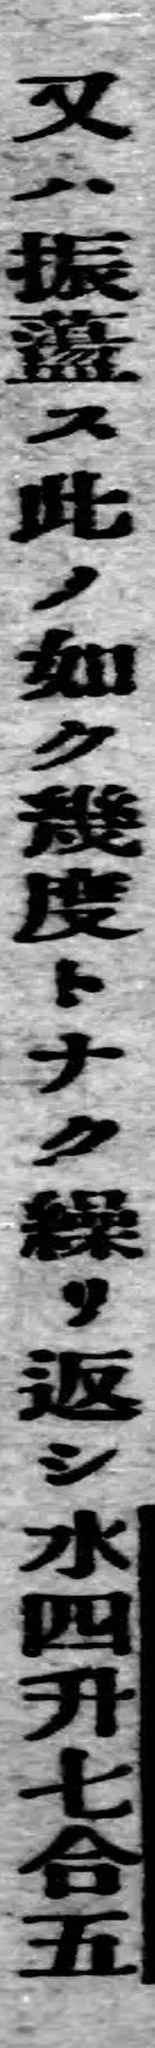又ハ振蘯ス此ノ如ク幾度トナク繰リ返シ水四升七合五
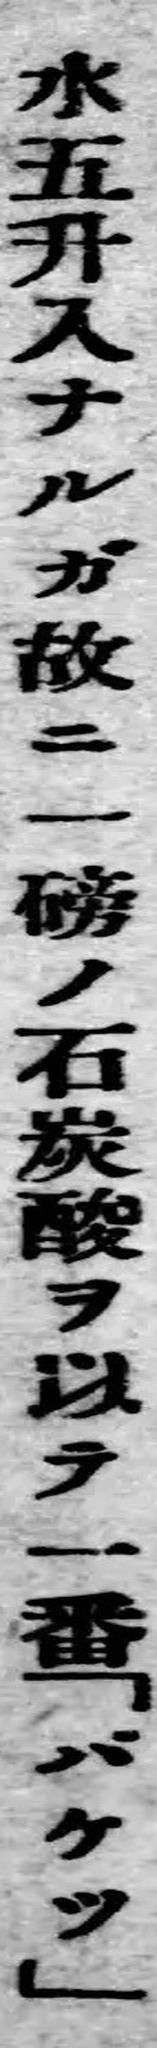水五升入ナルガ故ニ一磅ノ石炭酸ヲ以テ一番「バケツ」
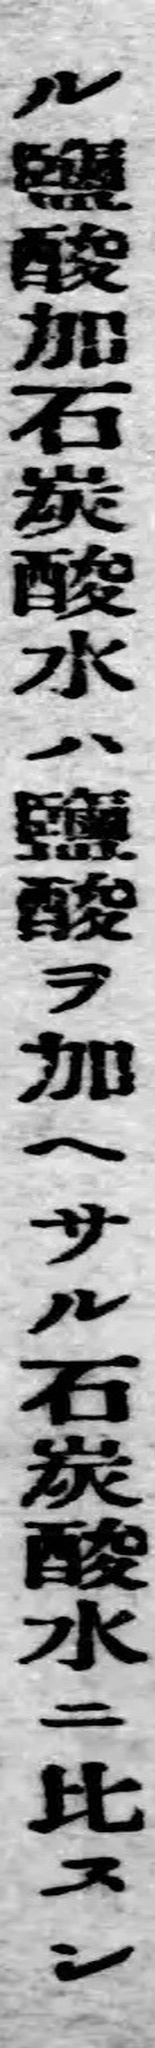ル鹽酸加石炭酸水ハ鹽酸加ヘサル石炭酸水ニ比ヌレ
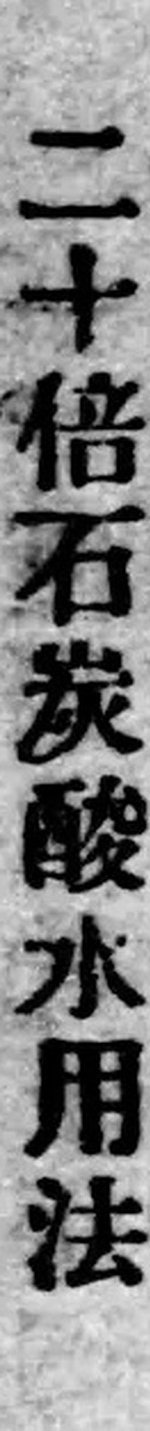二十倍石炭酸水用法

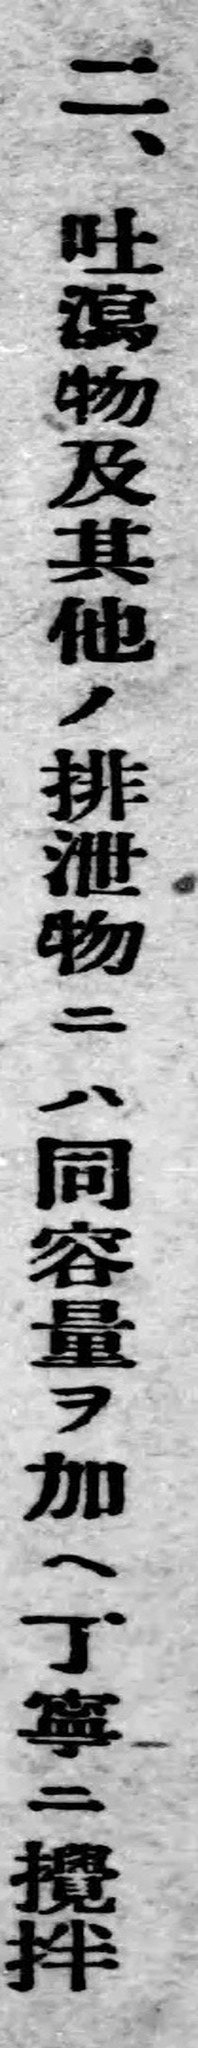二、吐瀉物及其他ノ排泄物ニハ同容量ヲ加ヘ丁寧ニ攪拌
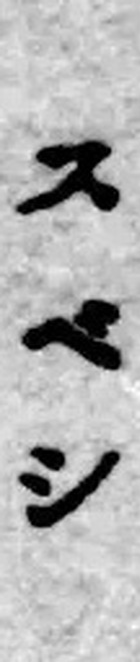スベシ
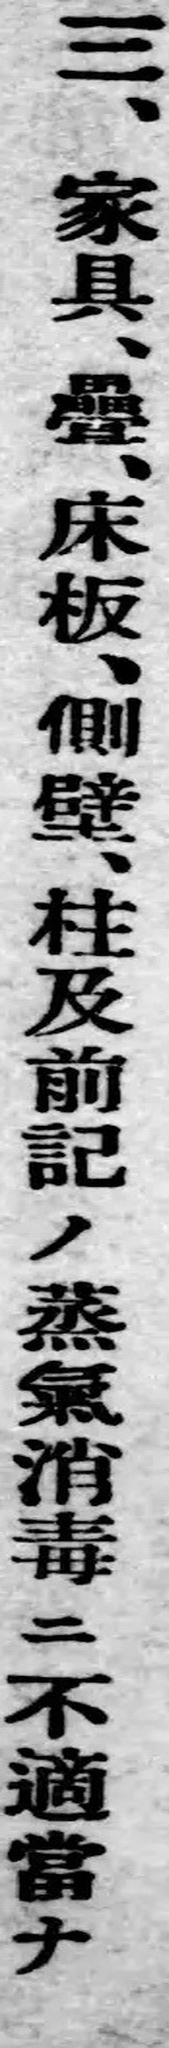三、家具、疊、床板、側壁、柱及前記ノ蒸氣消毒ニ不適當ナ
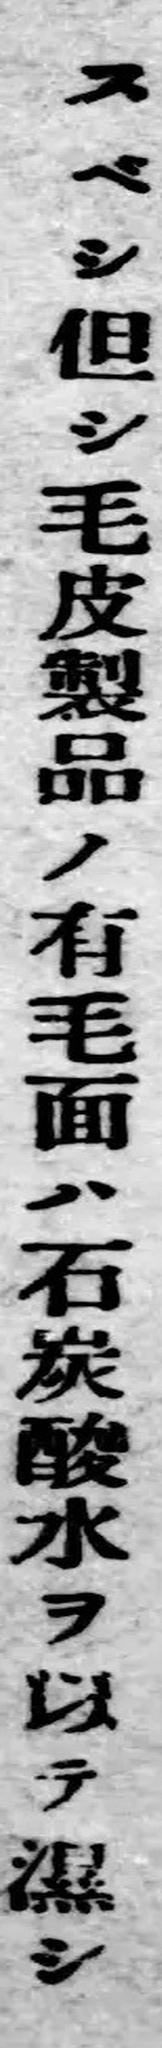スベシ但シ毛皮製品ノ有毛面ハ石炭酸水ヲ以テ濕シ
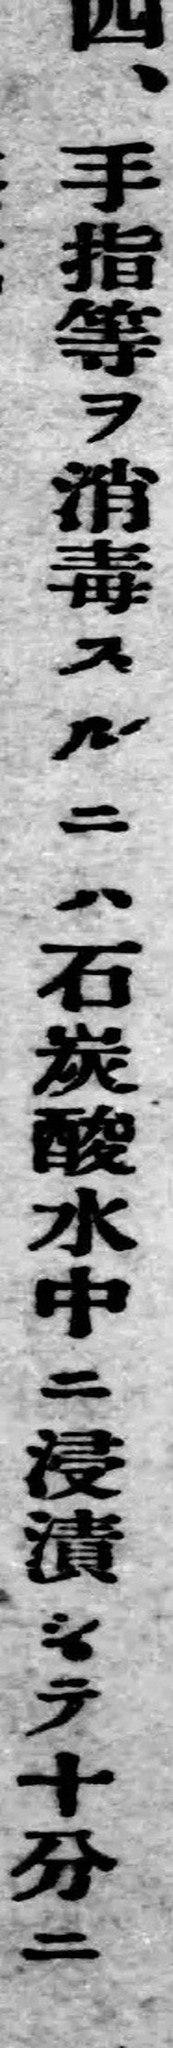四、手指等ヲ消毒スルニハ石炭酸水中ニ浸漬シテ十分ニ
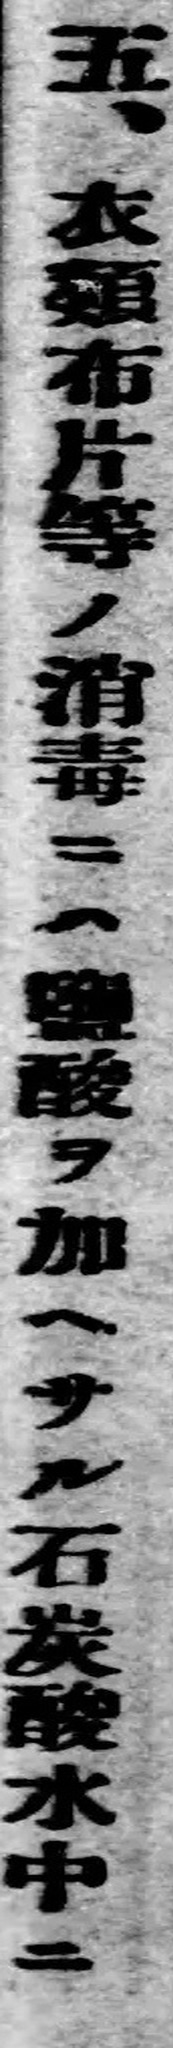五、衣類布片等ノ消毒ニハ鹽酸ヲ加ヘサル石炭酸水中ニ
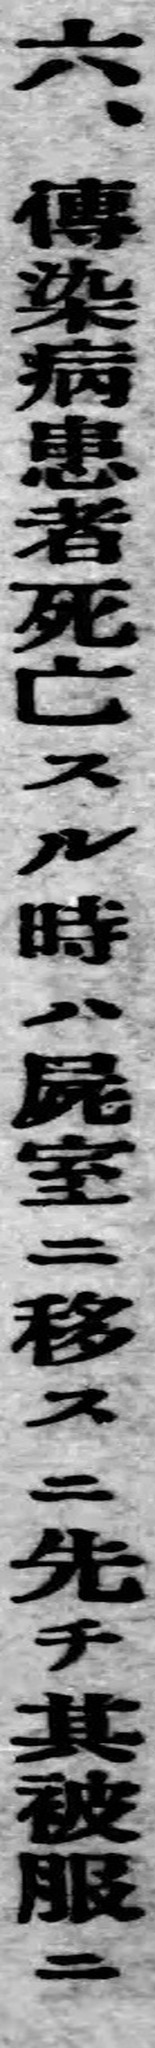六、傅染病患者死亡スル時ハ屍室ニ移スニ先チ其被服ニ
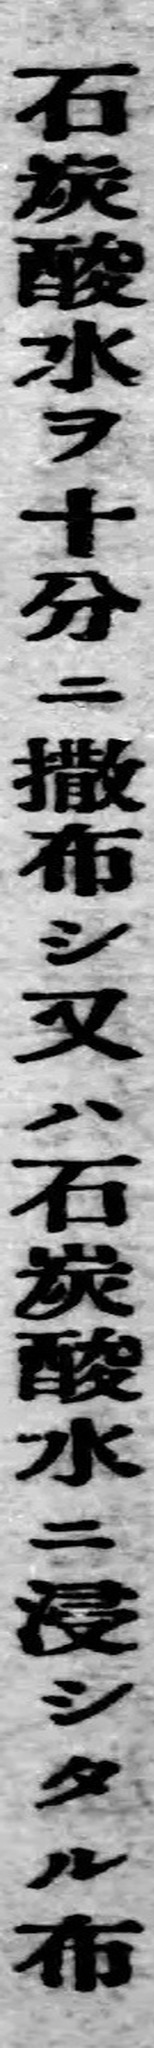石炭酸水ヲ十分ニ撒布シ又ハ石炭酸水ニ浸シタル布
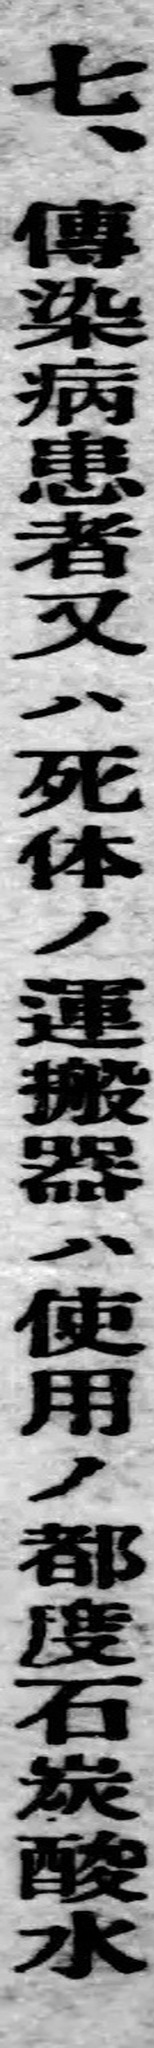七、傅染病患者又ハ死体ノ運搬器ハ使用ノ都度石炭酸水
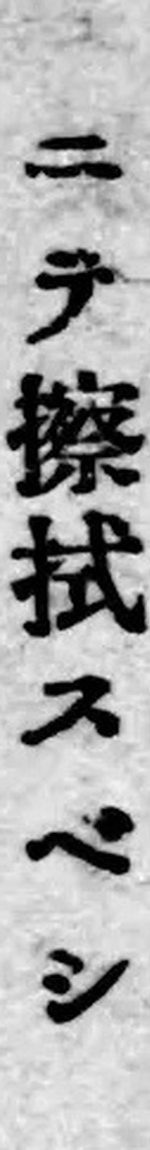ニテ擦拭スベシ

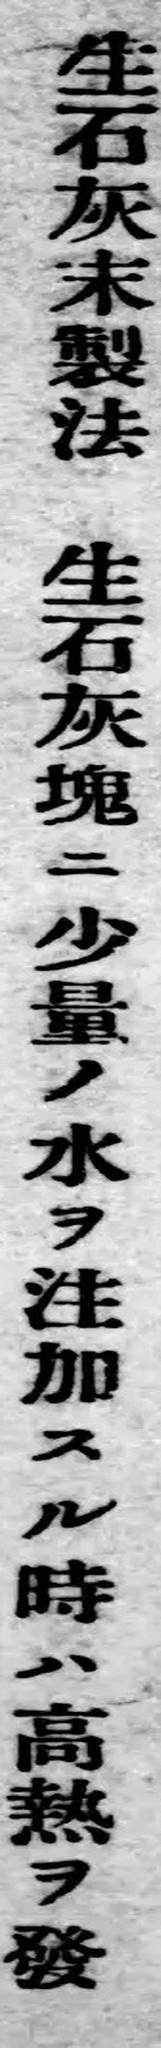生石灰末製法生石灰塊ニ少量ノ水ヲ注加スル時ハ高熱ヲ發
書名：袖珍防疫必携
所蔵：国立国会図書館 National Diet Library, JAPAN
